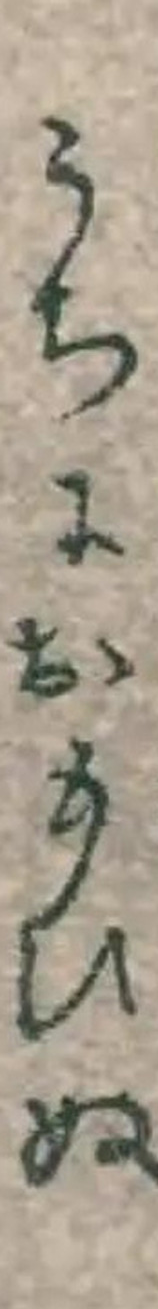うちにおもひぬ

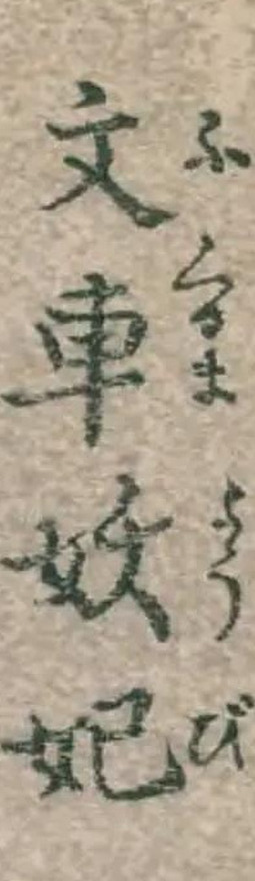文車妖妃
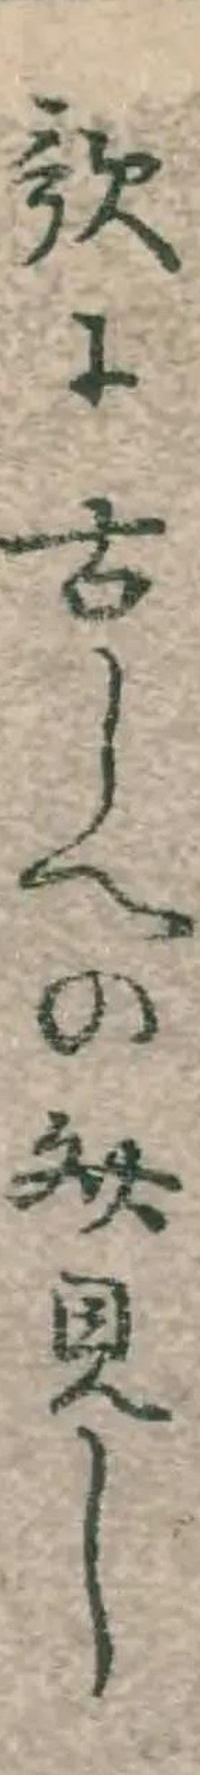歌に古しへの文見し
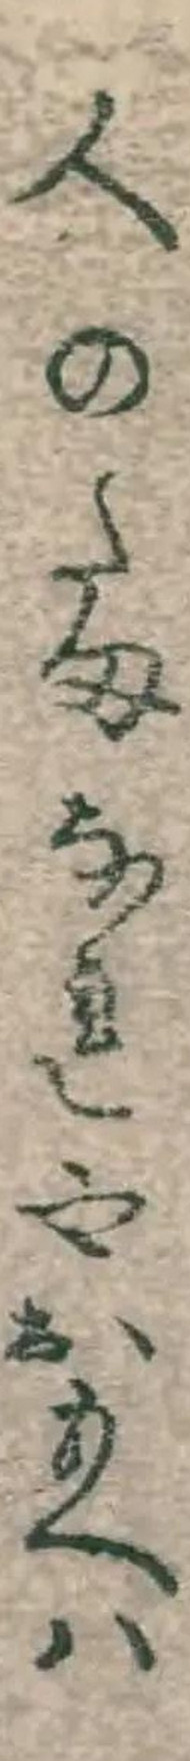人のたまなれやおもへは
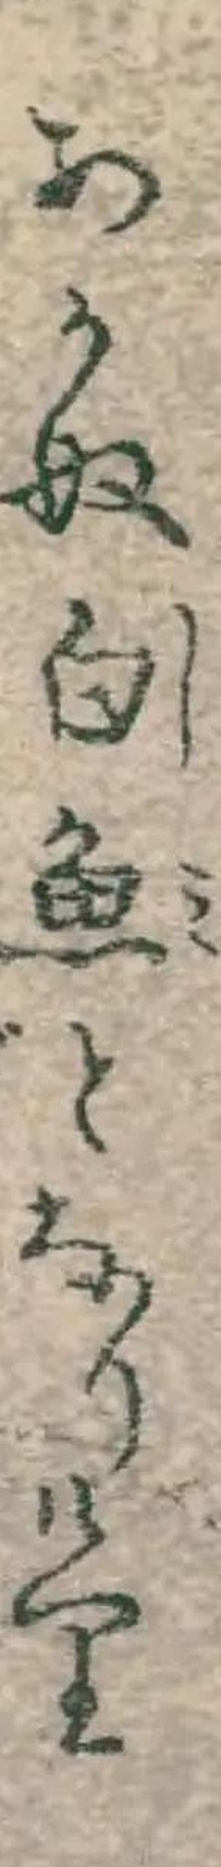あかぬ白魚となりけり
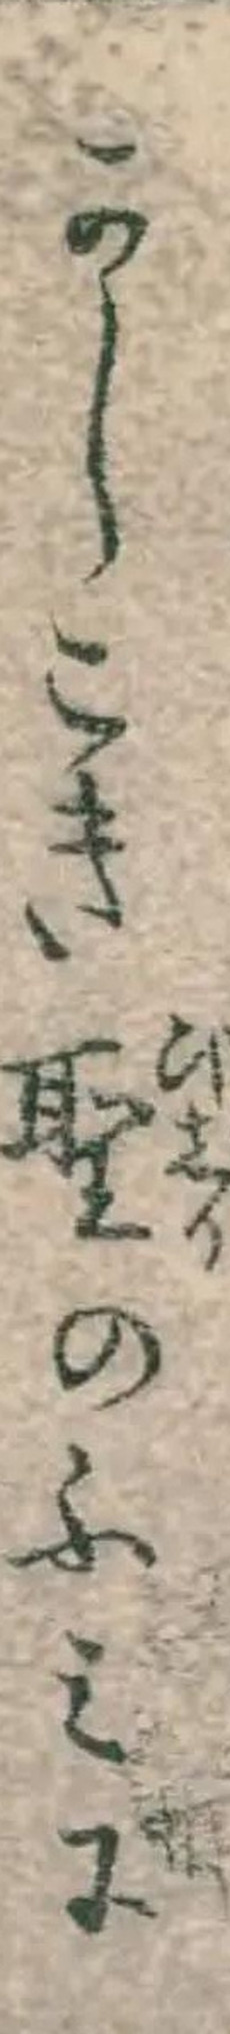かしこき聖のふみに
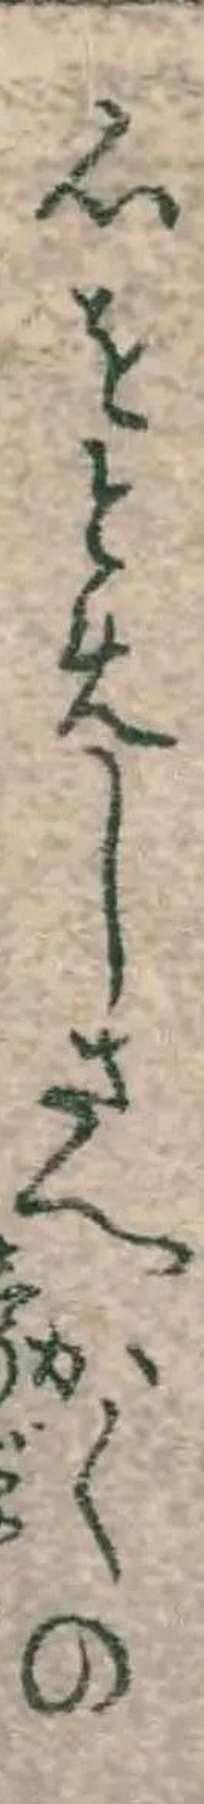心をとめしさへかくの
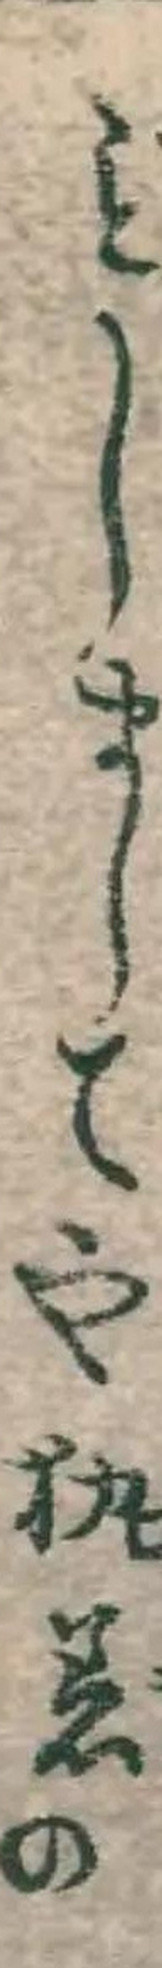ごとしましてや執着の
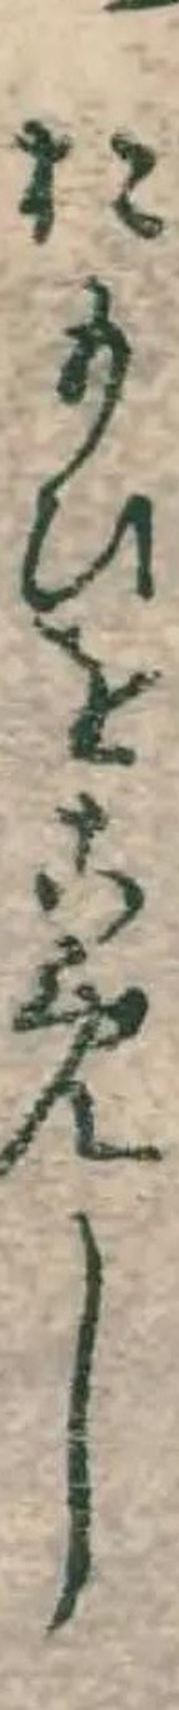おもひをこめし
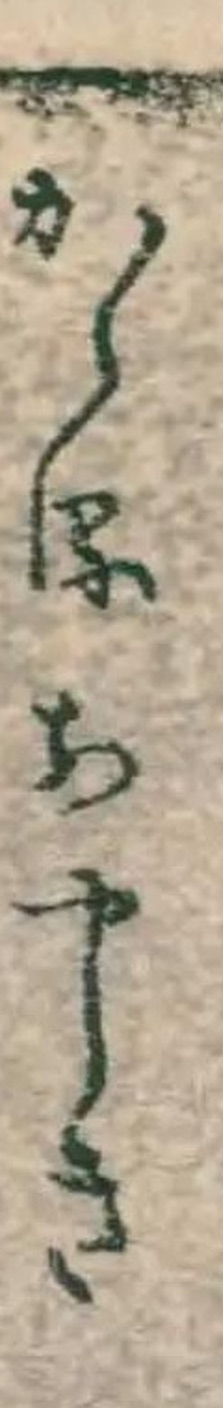かゝるあやしき
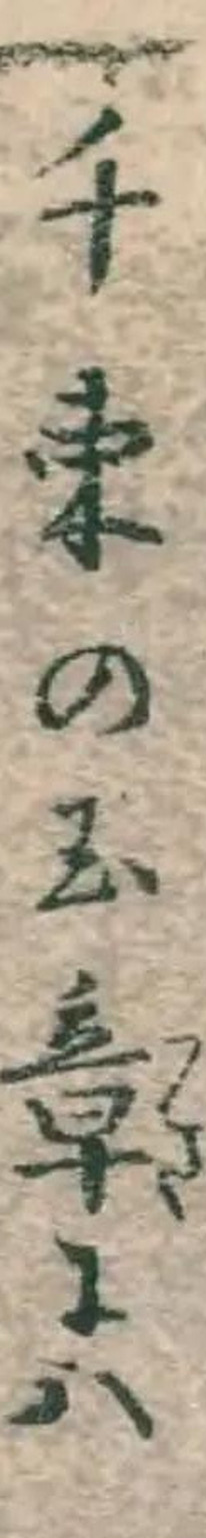千束の玉章には
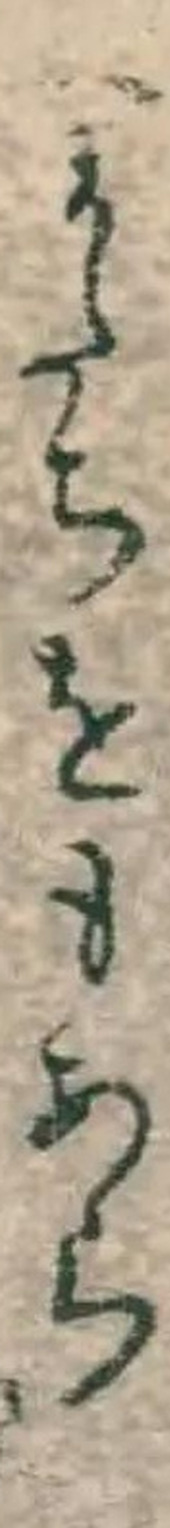かたちをもあら
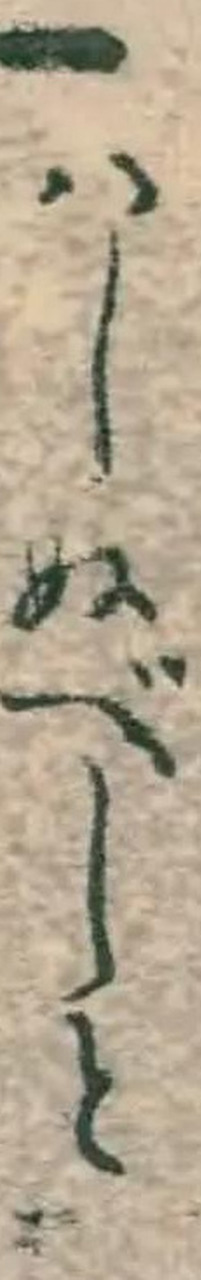はしぬべしと
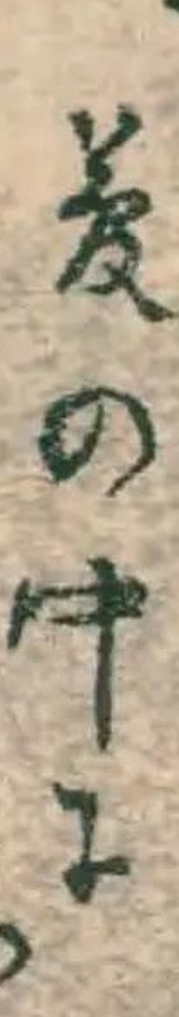夢の中に

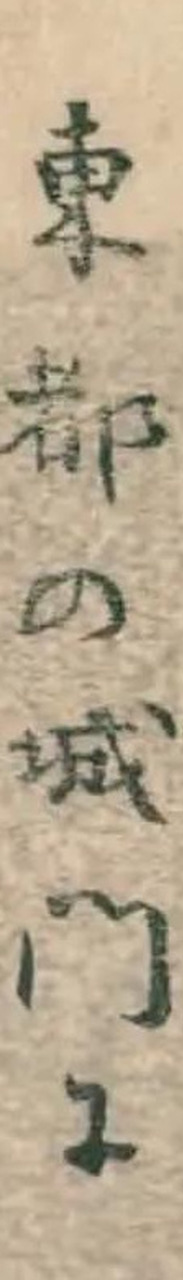東都の城門に
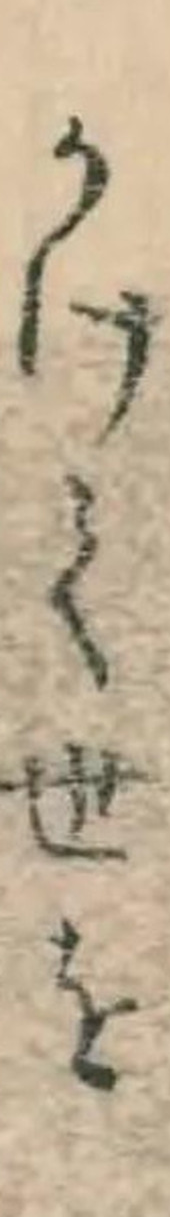かけて世を
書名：百鬼徒然袋 3巻. [1]
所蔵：国立国会図書館 National Diet Library, JAPAN
